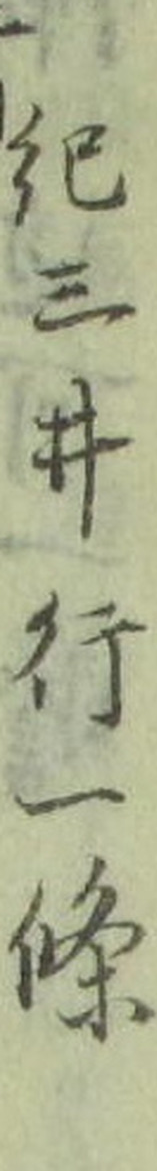紀三井行一条鳴
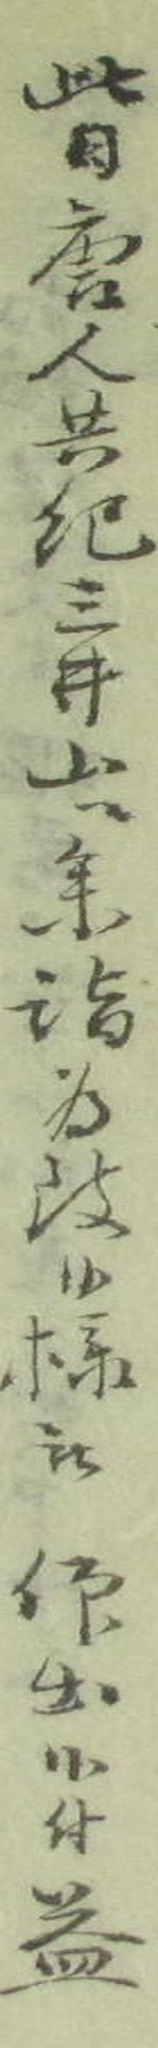此日唐人共紀三井山へ参詣為致候様被仰出候付益
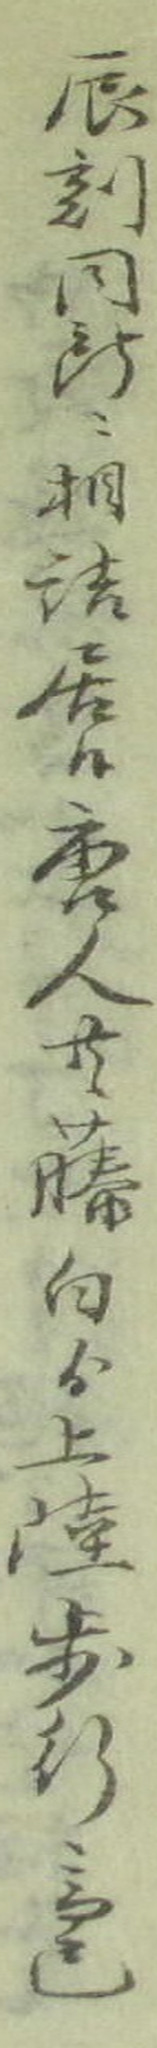辰刻同所に相詰居候唐人共藤白ゟ上陸歩行に而已
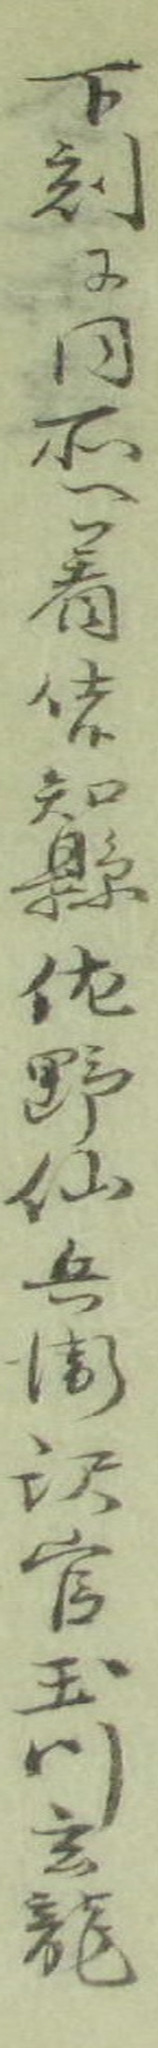下刻に同所へ着仕候知県佐野仙兵衛訳官玉川玄龍
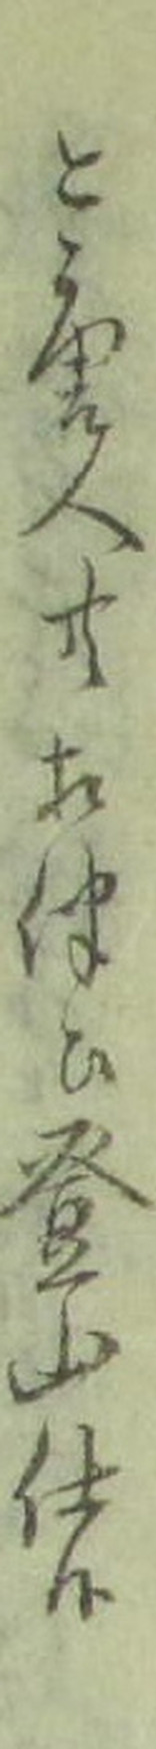と唐人共相伴ひ登山仕候
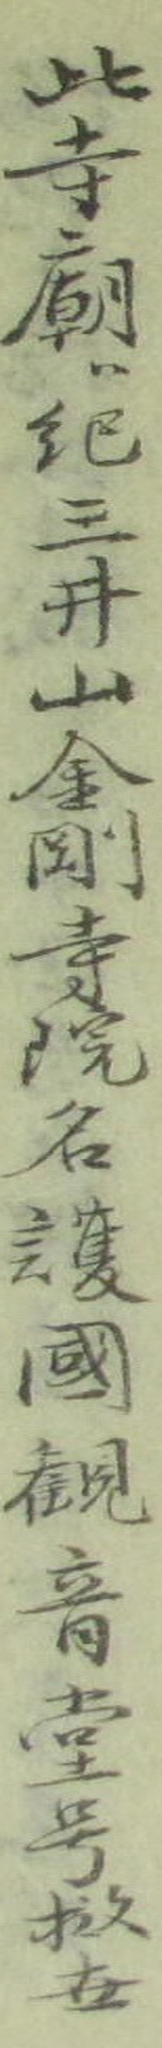此寺廟は紀三井山金剛寺院名護国観音堂号救世
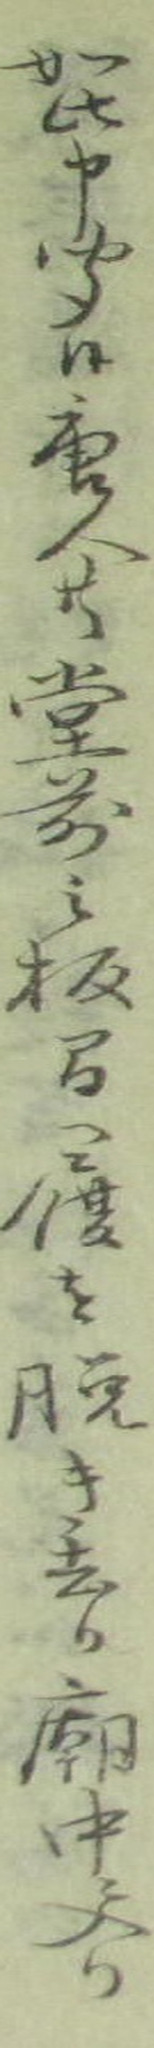如此申聞候唐人共堂前之板間へと服を脱き去り廟中に入り
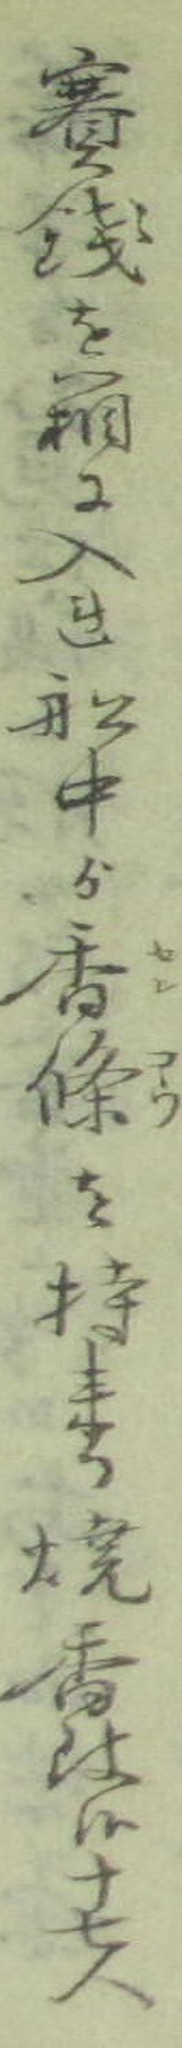賽銭を箱に入れ船中ゟ香条を持来り焼香致候十七人
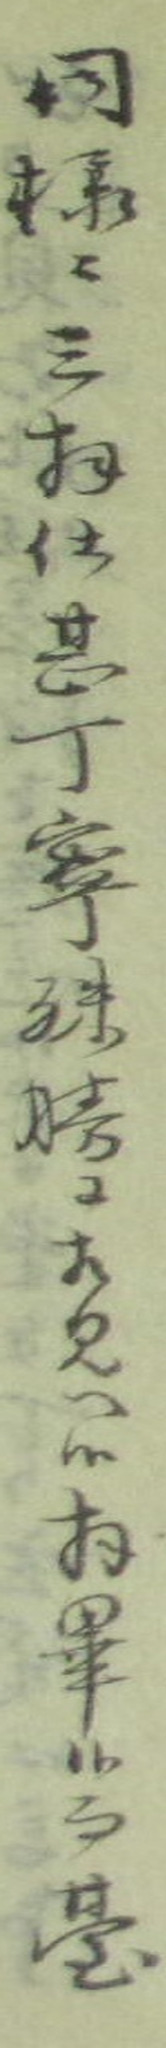同様に三拝仕甚丁寧殊勝に相見へ候拝畢候而台

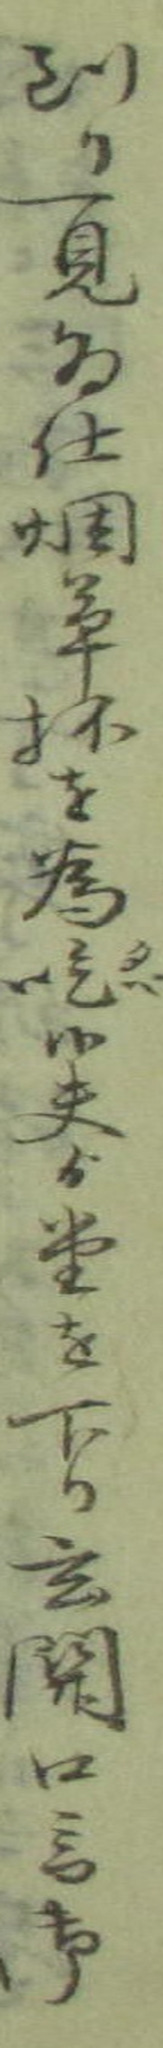到り一見為仕烟草抔を為吃候夫ゟ堂を下り玄関口に而御
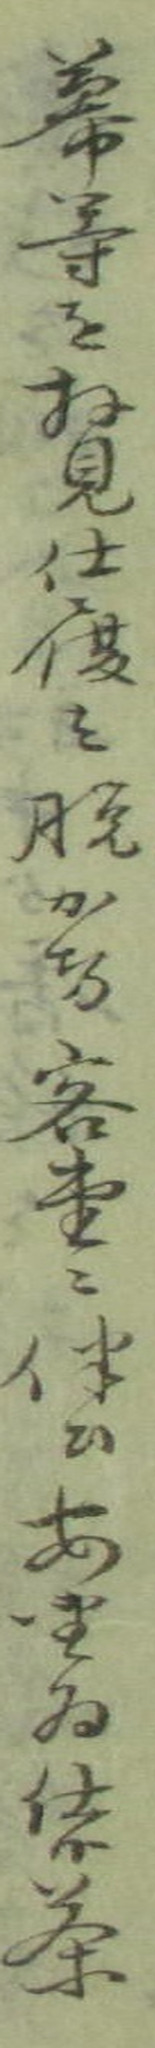幕等を拝見仕履を脱かせ客堂に伴ひ安坐為仕候茶
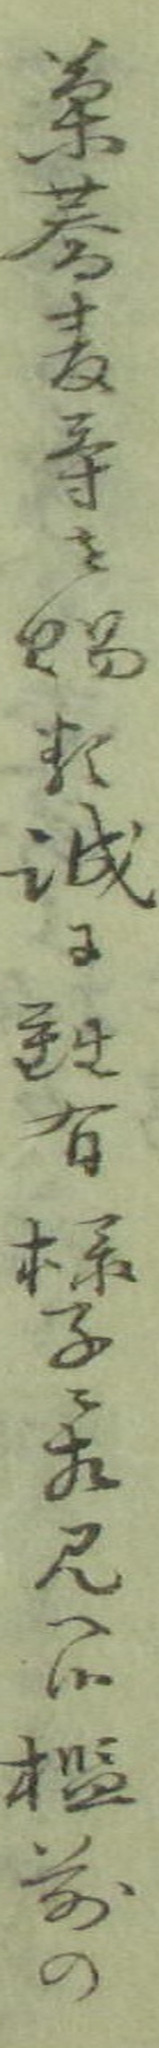菓蕎麦等を賜る誠に難有様子に相見へ候檻前の
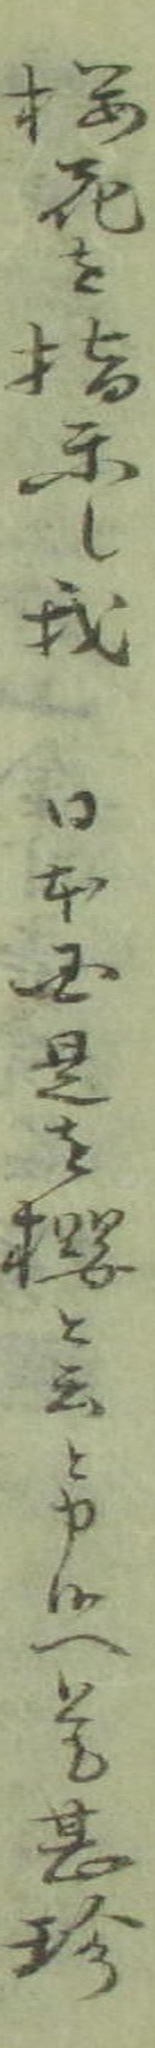桜花を指示し我日本国是を桜と云と申候へとも甚珍
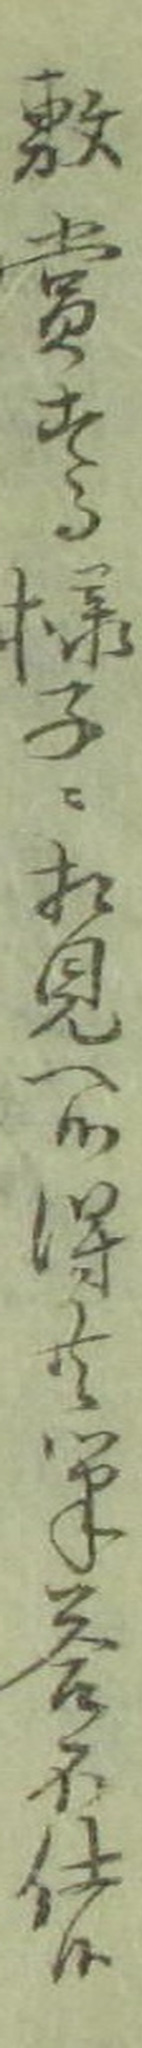敷賞する様子に相見へ候得共筆答不仕候
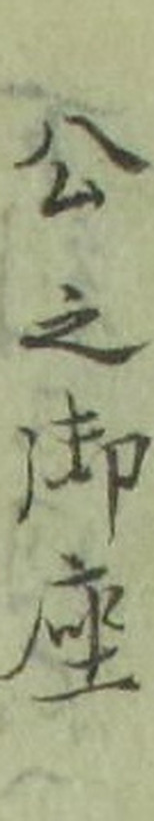公之御座
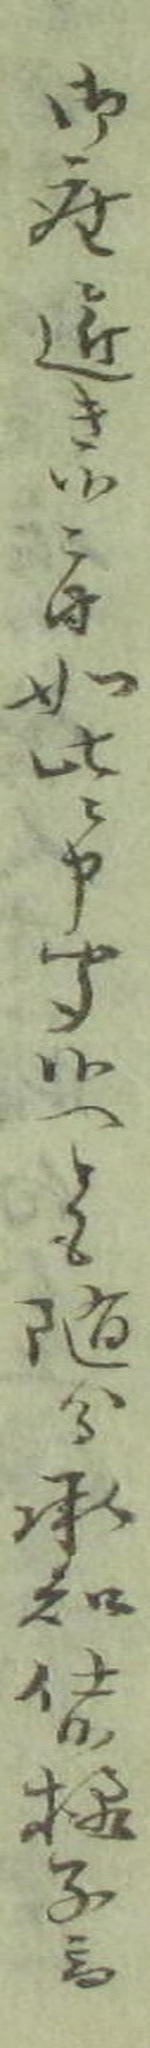御座に近き候に付如此に申聞候へとも随分承知仕候様子に而
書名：紀州九木浦庄屋記録 四
